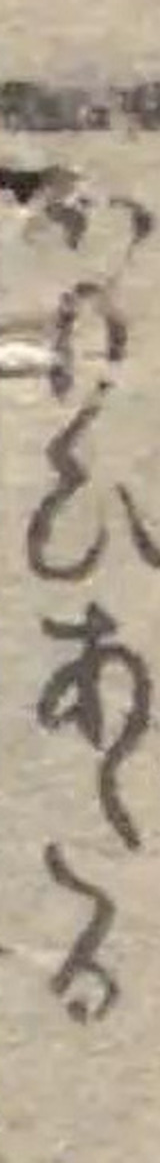おもひあたる
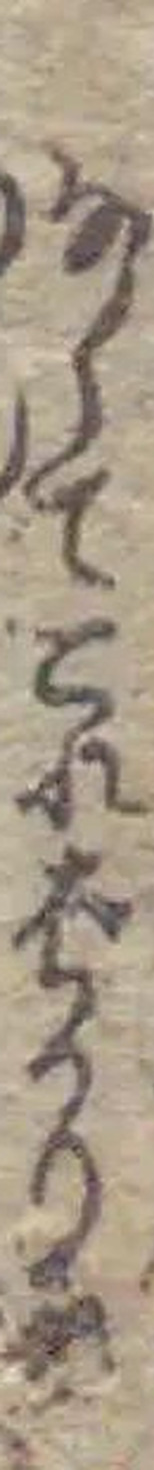なくてこればかりは
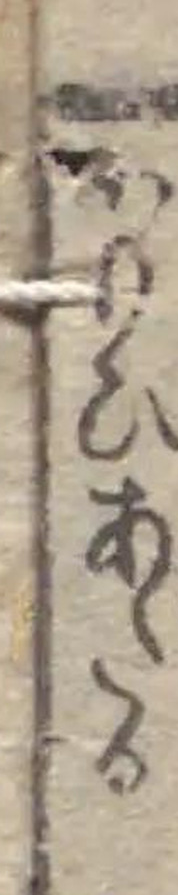おもひあたる

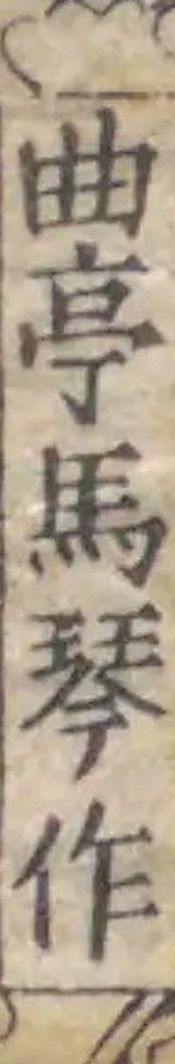曲亭馬琴作

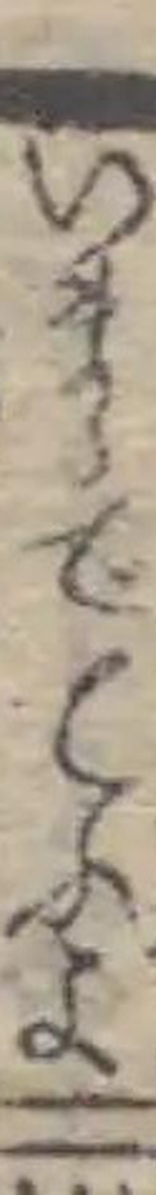いまゝでてふよ
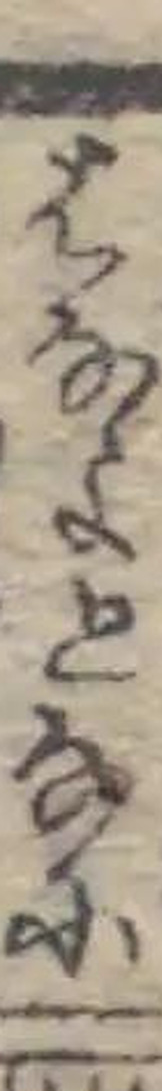はなよとなに
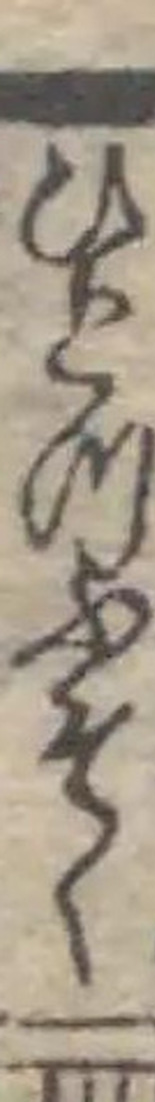ひとつふそく
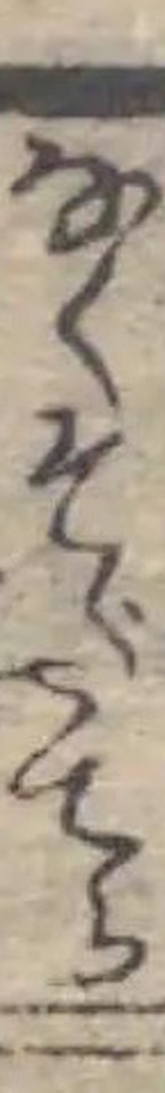なくそだてら
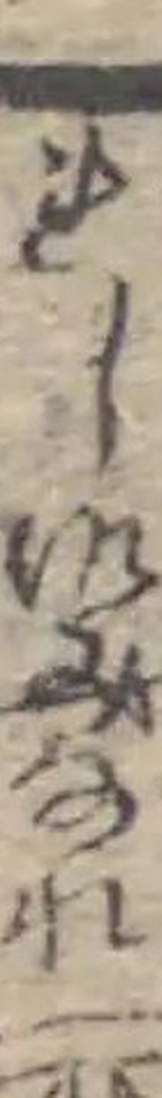れし御みなれ
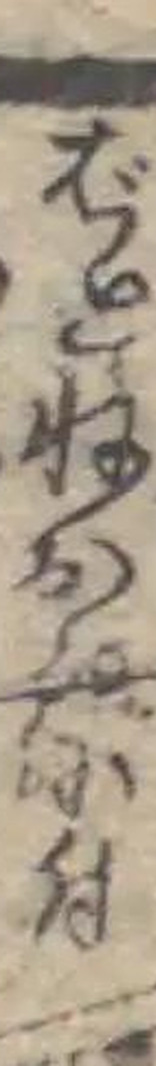ばとねおきに付
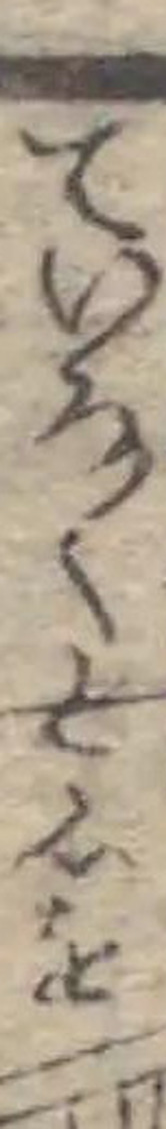ていろ〳〵と心を
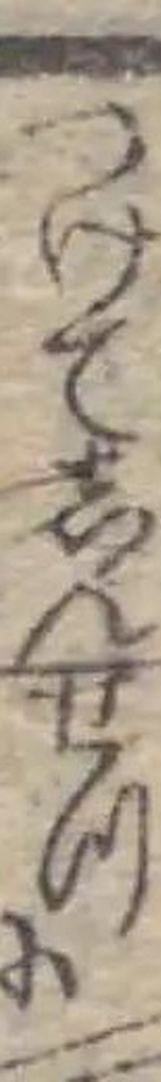つけてしんせつに
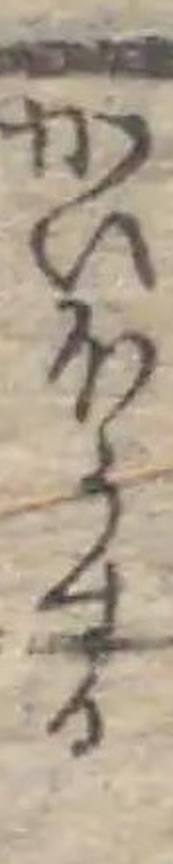かいほうする
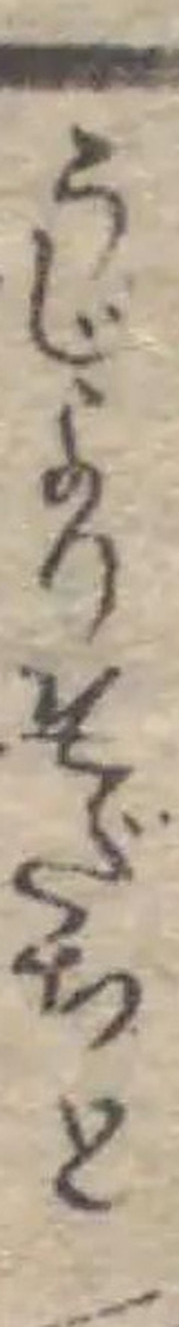うじよりそだちと
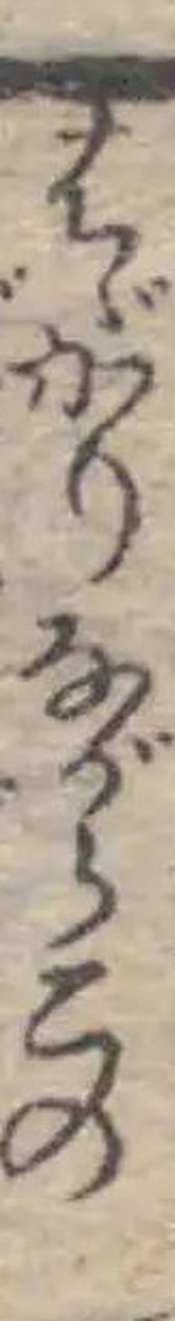はゞかりながらこの
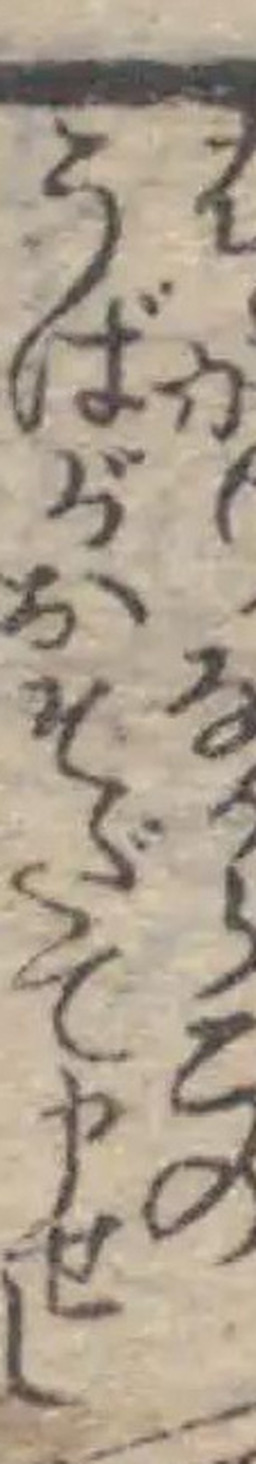うばがおそだてもうせし
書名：福壽海旡量品玉 3巻
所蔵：国立国会図書館 National Diet Library, JAPAN
